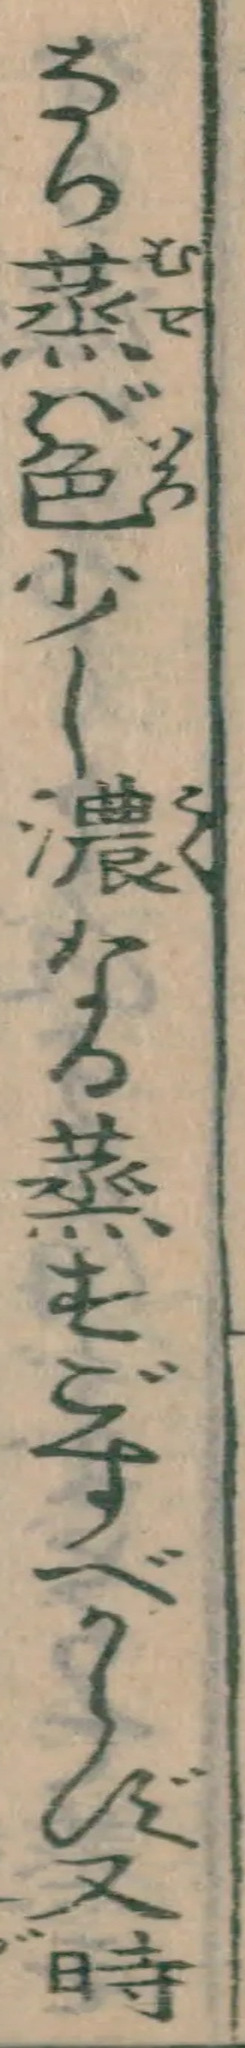なり蒸ば色少し濃なる蒸すごすべからず又時
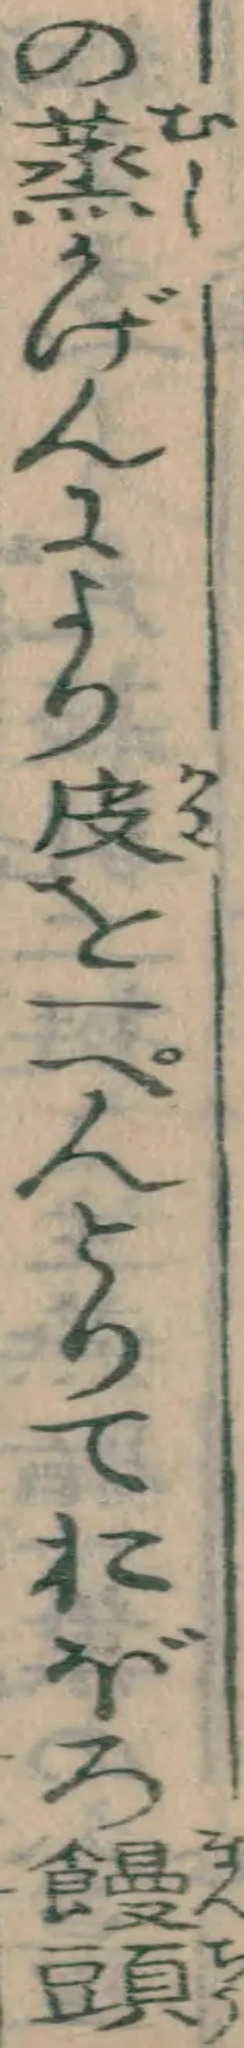の蒸かげんにより皮を一ぺんとりておぼろ饅頭
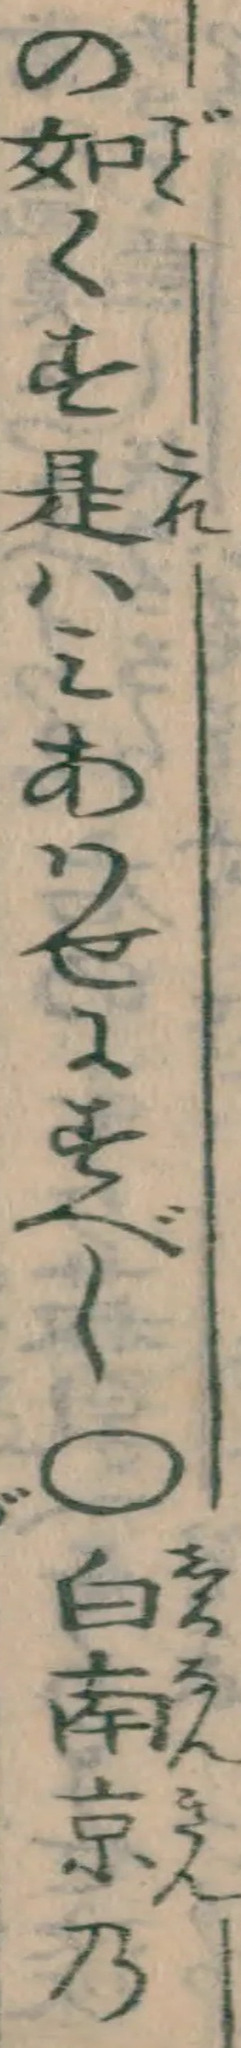の如くす是はみあはせにすべし○白南京の
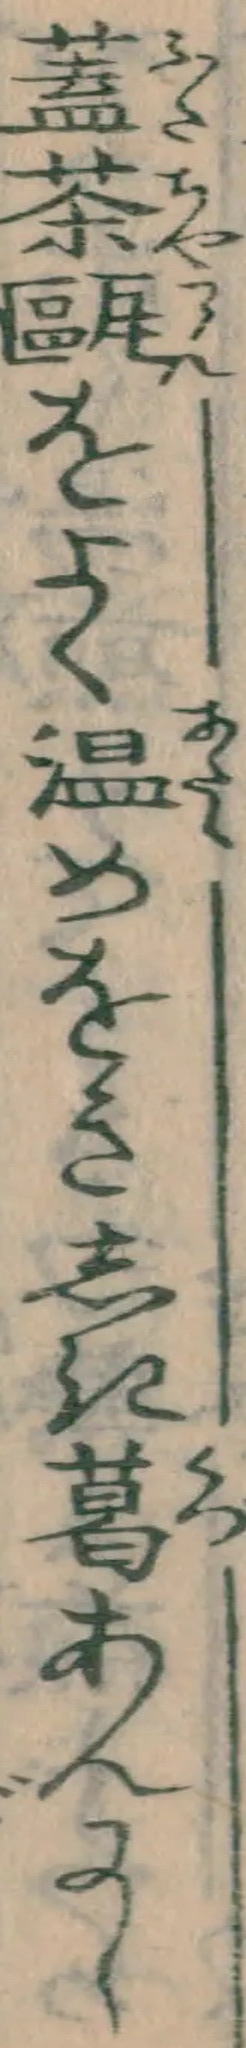蓋茶甌をよく温めをきしき葛あんにし
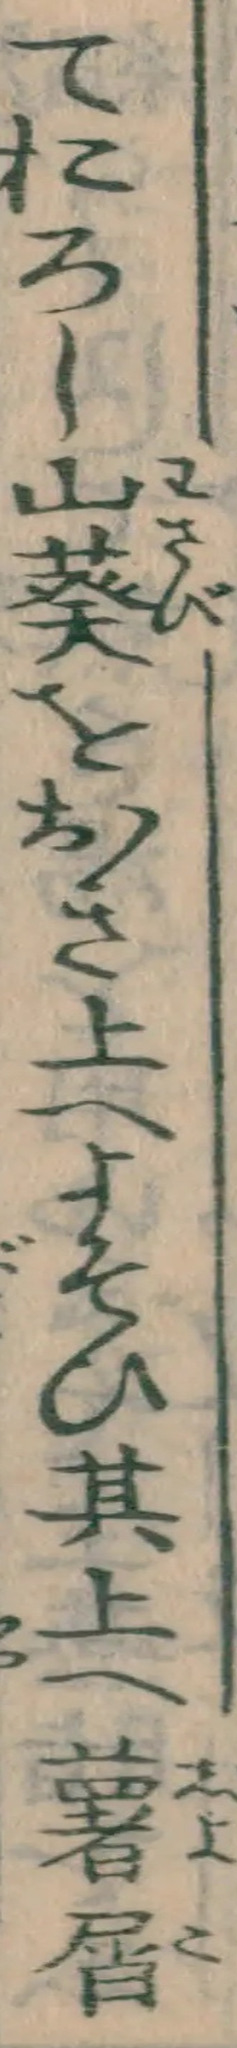ておろし山葵をおき上へよそひ其上へ薯屑
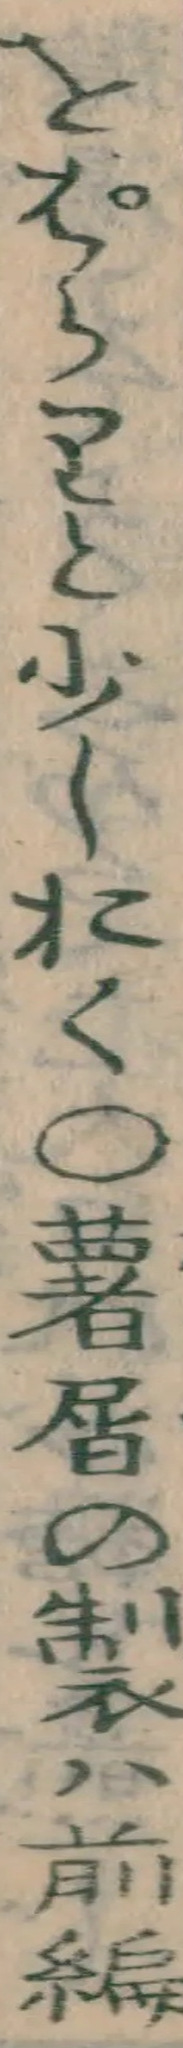をぱらりと少しおく○薯屑の製は前編
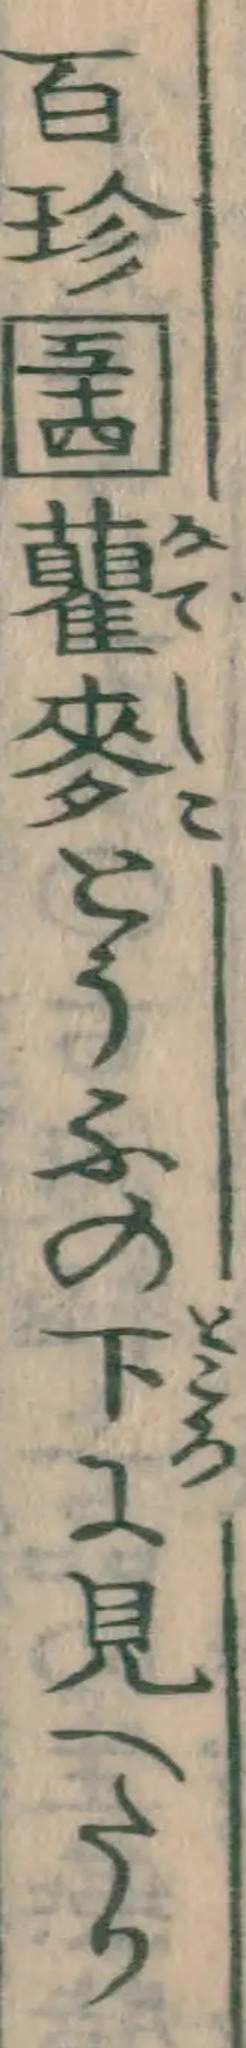百珍五十四瞿麦とうふの下に見へたり
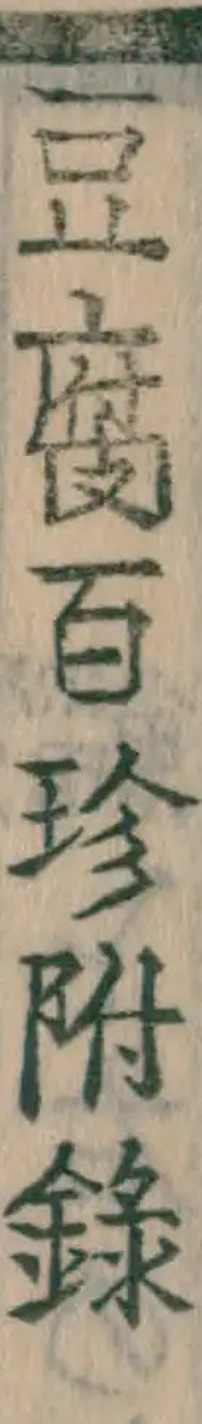豆腐百珍附録
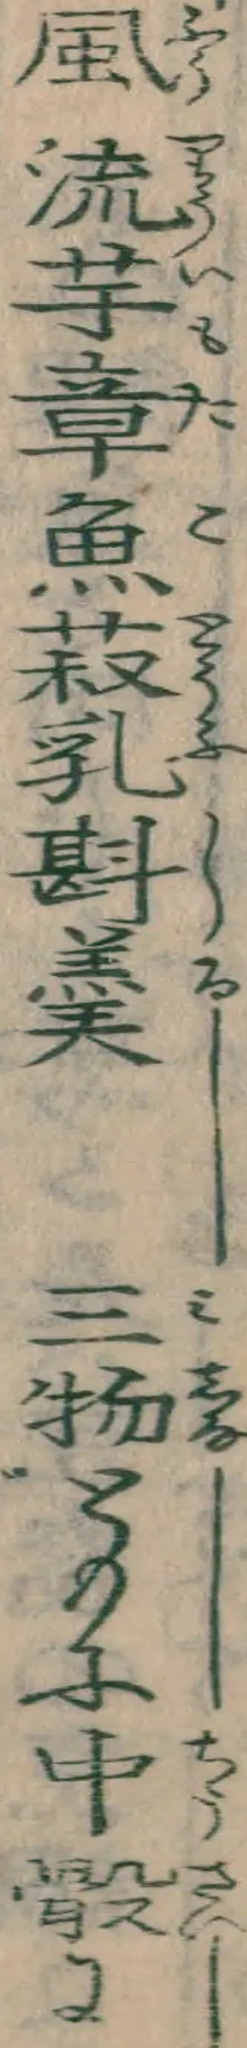壱風流芋章魚菽乳斟羹三物ともに中骰に
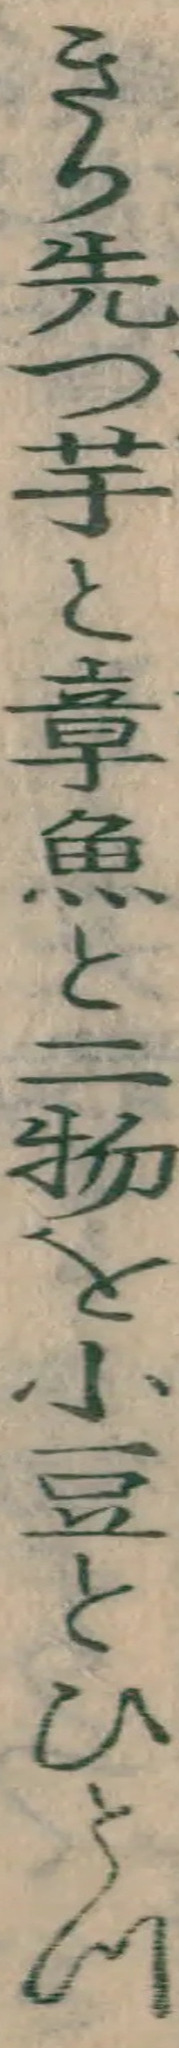きり先づ芋と章魚と二物を小豆とひとつ
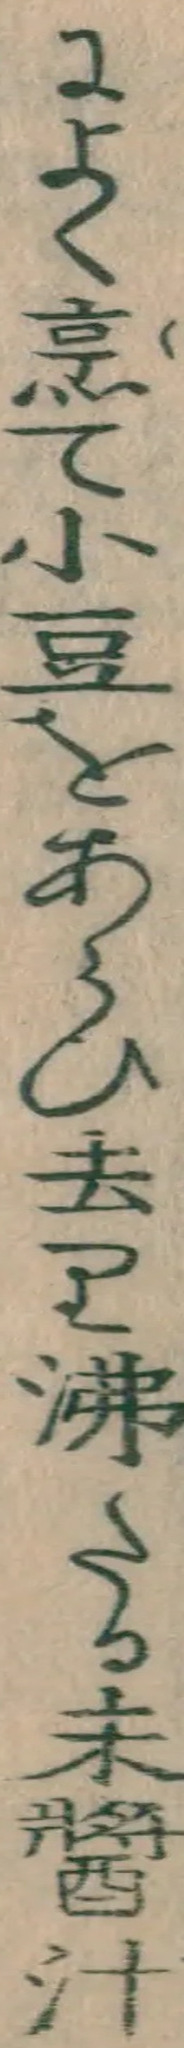によく烹て小豆をあらひ去り沸たる未醤汁
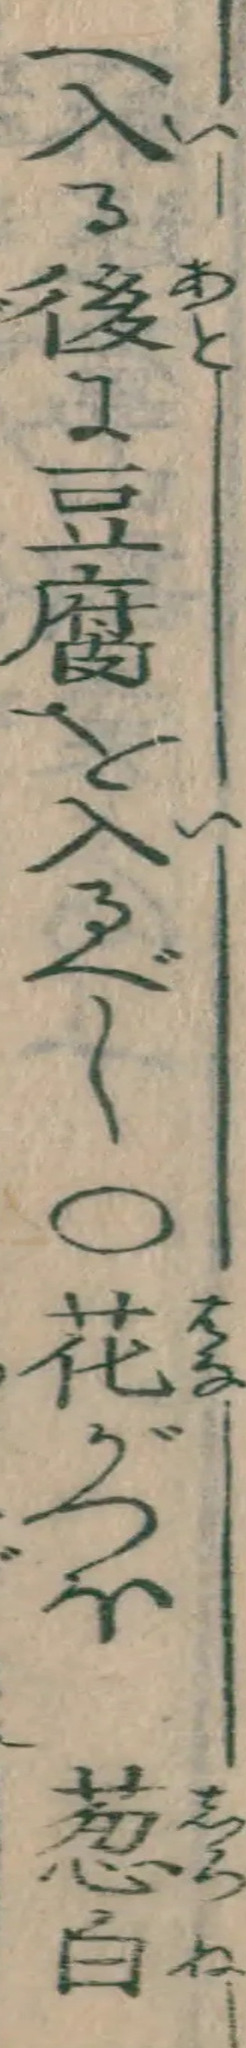へ入る後に豆腐を入るべし○花がつほ葱白
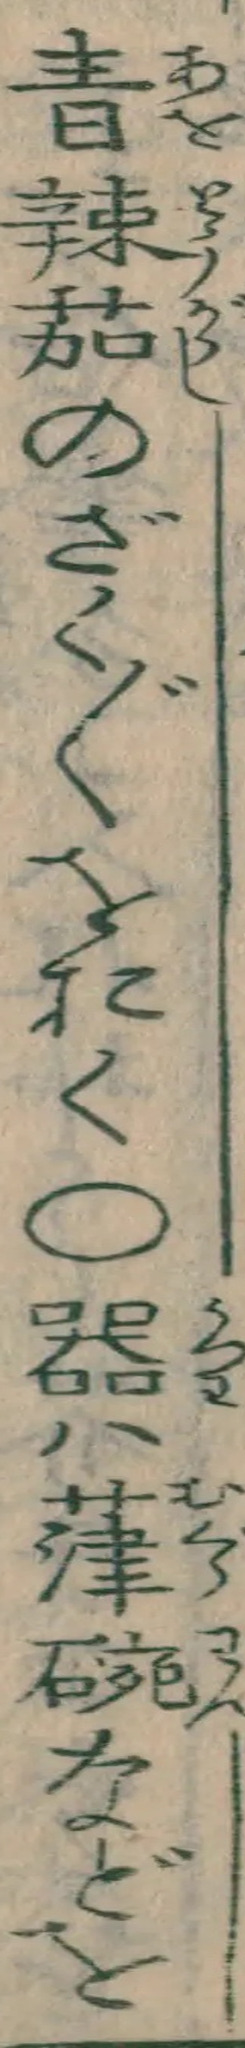青辣茄のざく〴〵をおく○器は葎碗などを
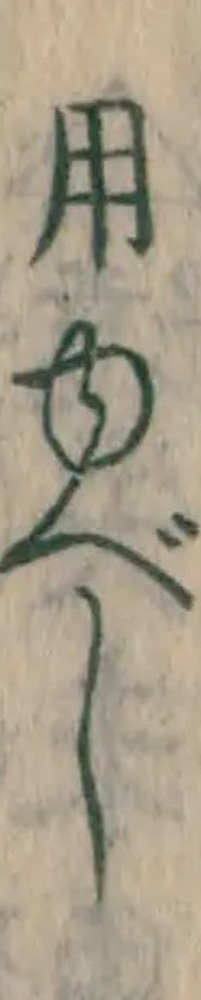用ゆべし
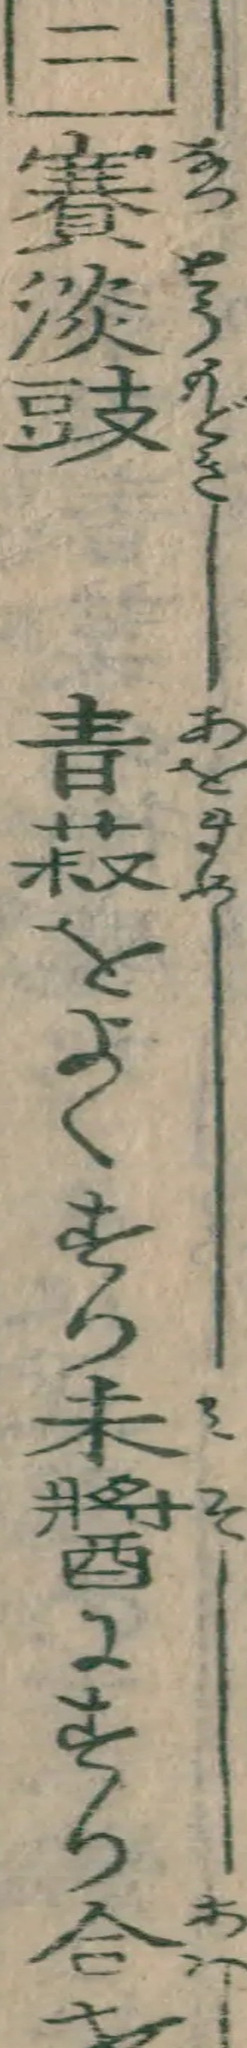二賽淡豉青菽をよくすり未醤にすり合せ

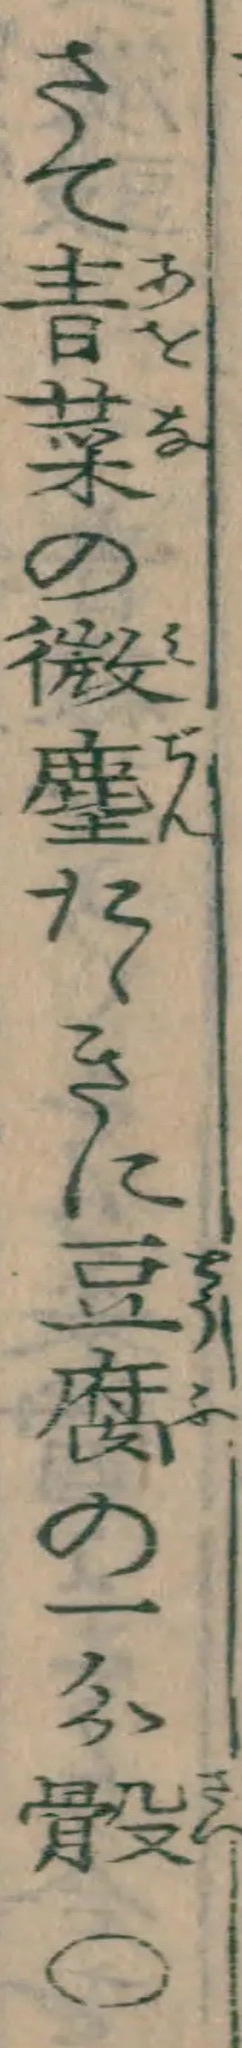さて青菜の微塵たゝきに豆腐の一分骰○
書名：豆腐百珍. 続編
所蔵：国立国会図書館 National Diet Library, JAPAN
